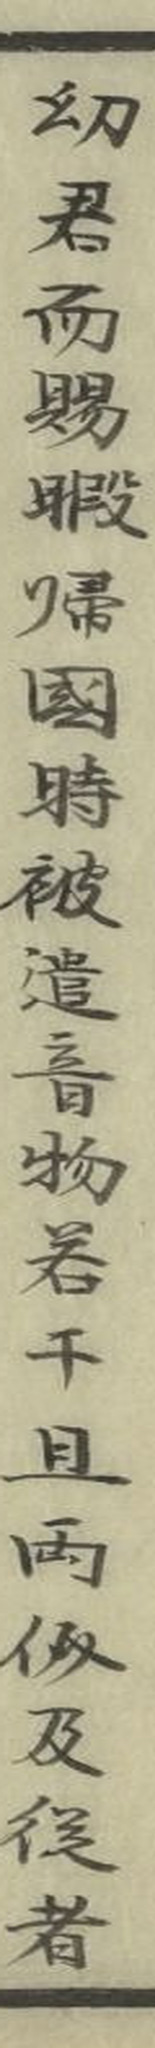幼君而賜暇帰国時被遣音物若干且両价及従者
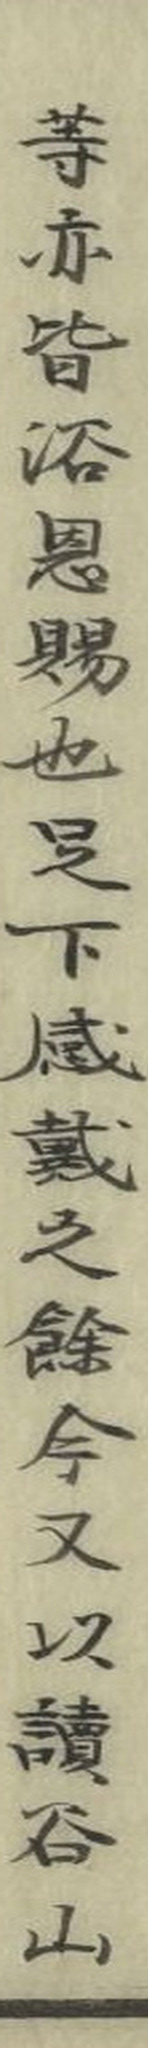等亦皆浴恩賜也足下感載之余今叉以読谷山
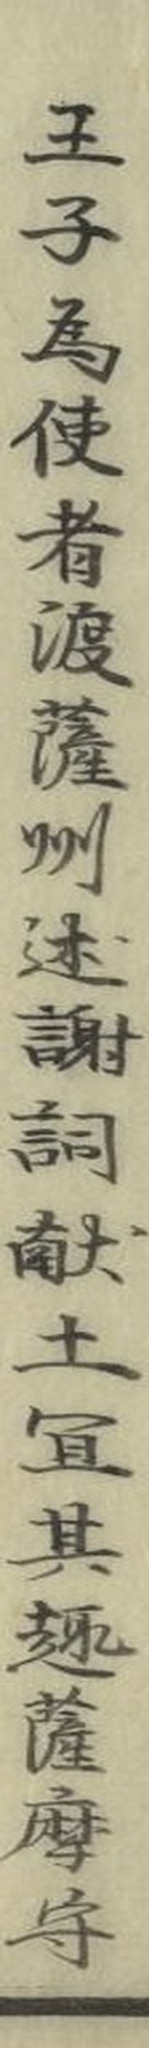王子為使者渡薩州述謝詞献土宜其趣薩摩守
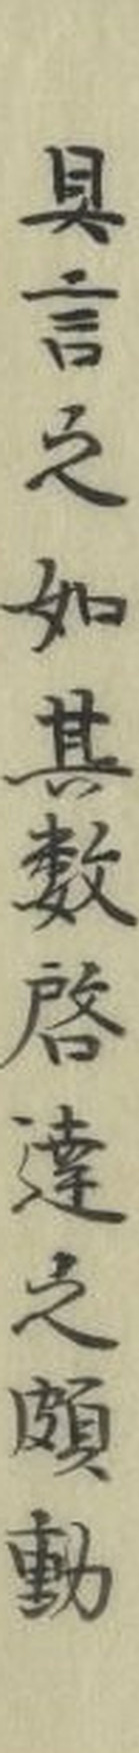具言之如其数啓達之頗動
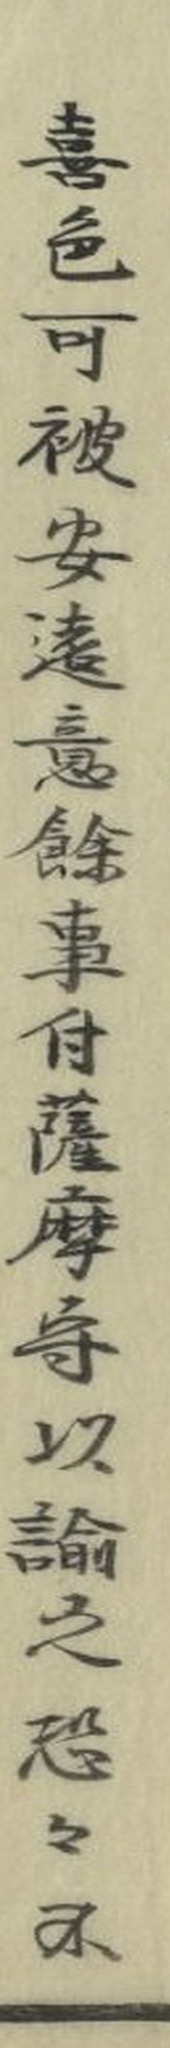喜色可被安遠意余事付薩摩守以諭之恐々不
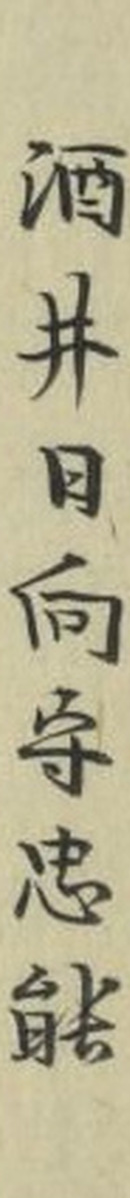酒井日向守忠能
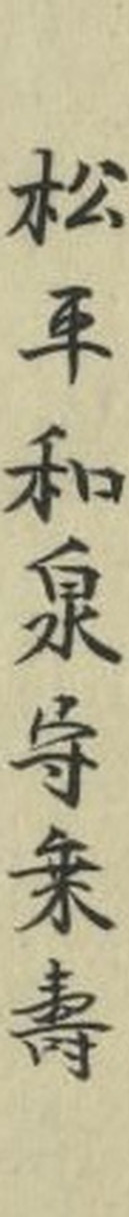松平和泉守乗寿
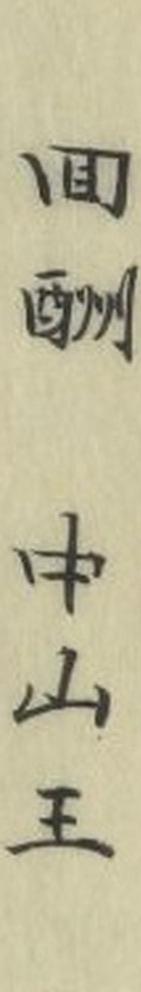回酬中山王
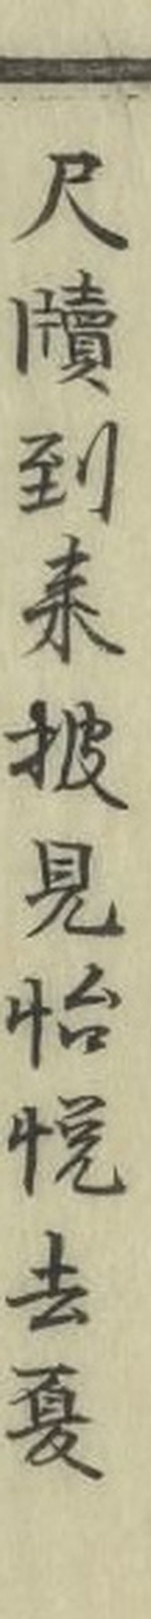尺牘到来披見怡悦去夏
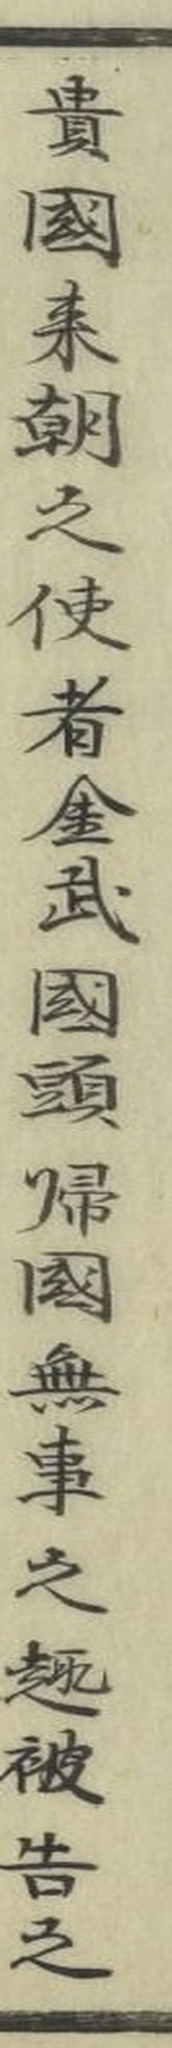貴国来朝之使者金武国頭帰国無事之趣披告之
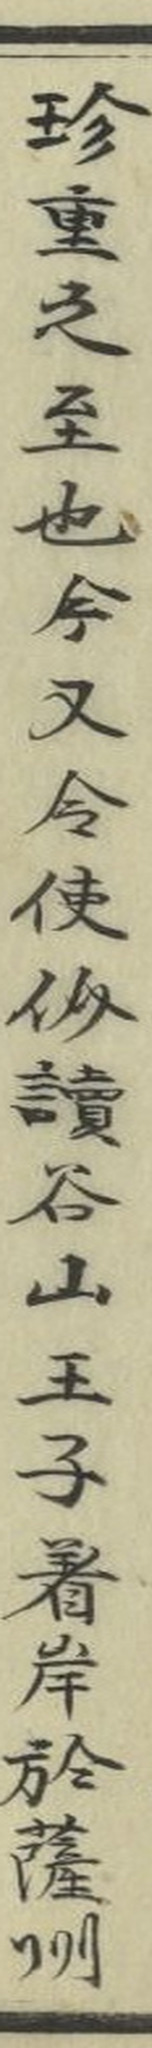珍重之至也今叉令使价読谷山王子着岸於薩州
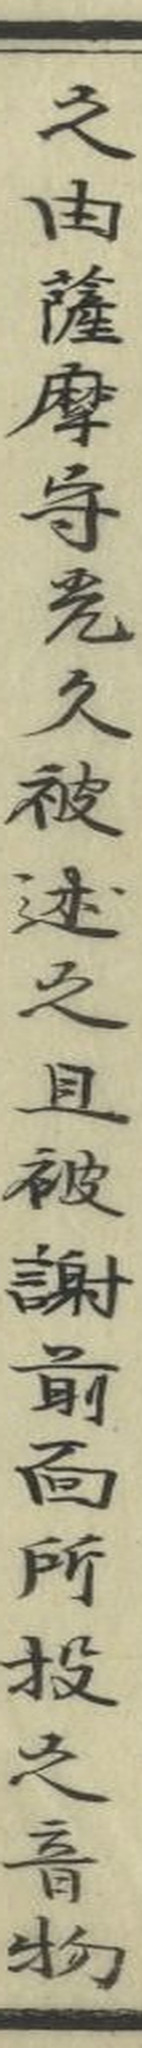之由薩摩守充久被述之且被謝前面所投之音物
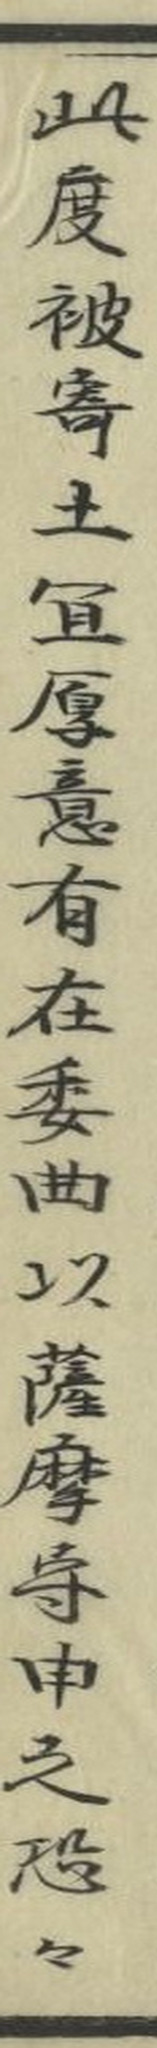此度被寄土宜厚意有在委曲以薩摩守申之恐々

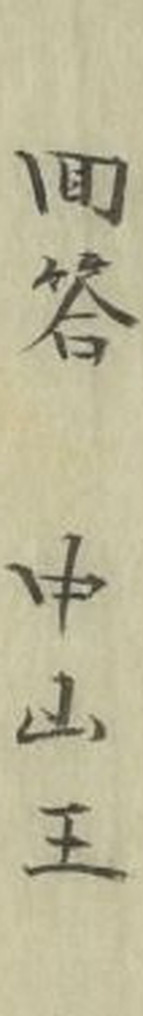回答中山王
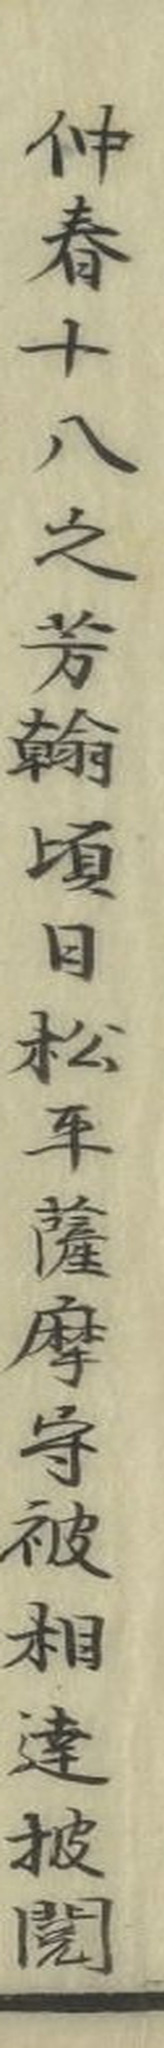仲春十八之芳翰頃日松平薩摩守被相違被閲
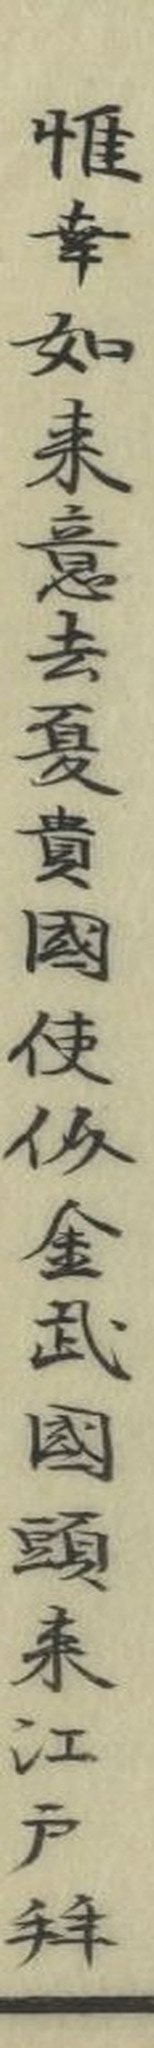惟幸如来意去夏貴国使价金武国頭来江戸拝
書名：琉球往来（上）
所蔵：University of the Ryukyus Library
